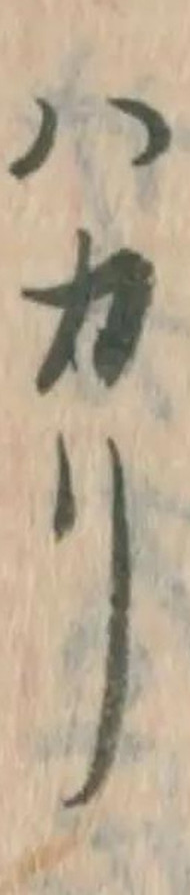ハカリ
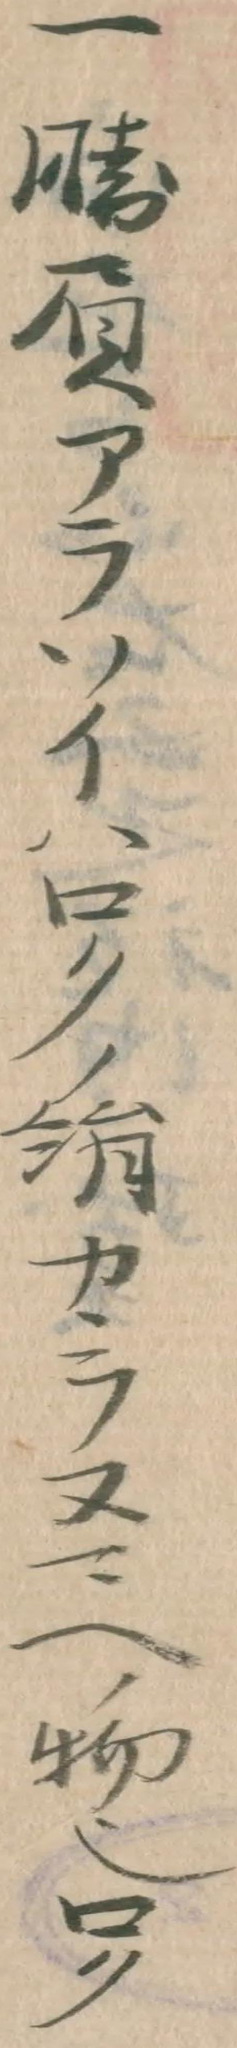一勝負アラソイハロクノ絹カヽラヌマヘノ物也口ク
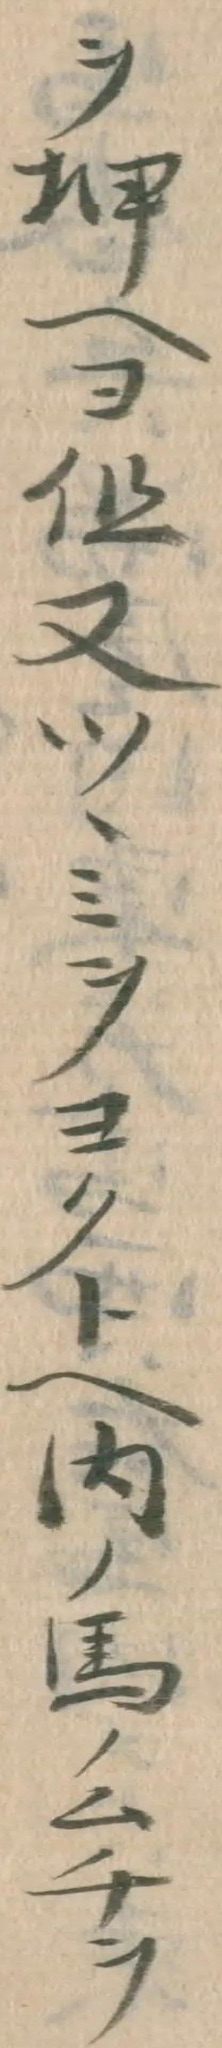ヲ押ヘヨ但又ツヽミヲヨクトヘ内ノ馬ノムチヲ
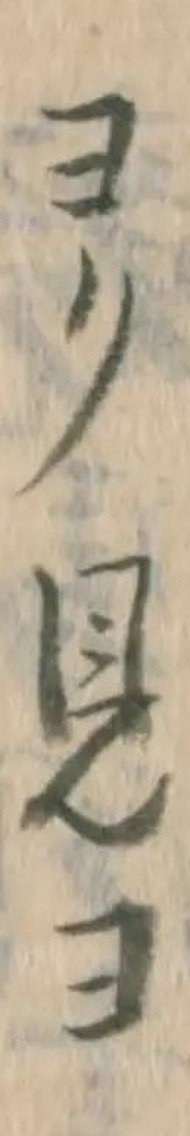ヨリ見ヨ
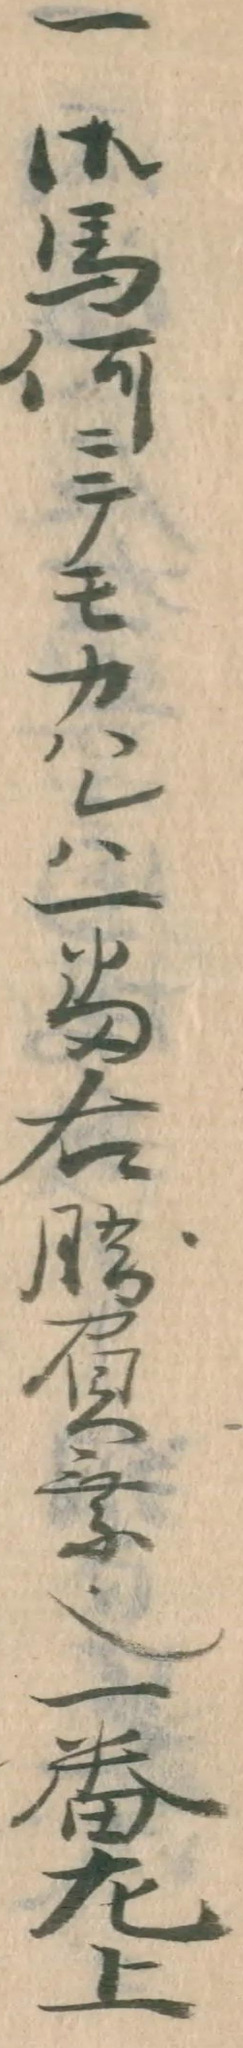一御馬何ニテモカハレハ一番右勝負乗也一番左上
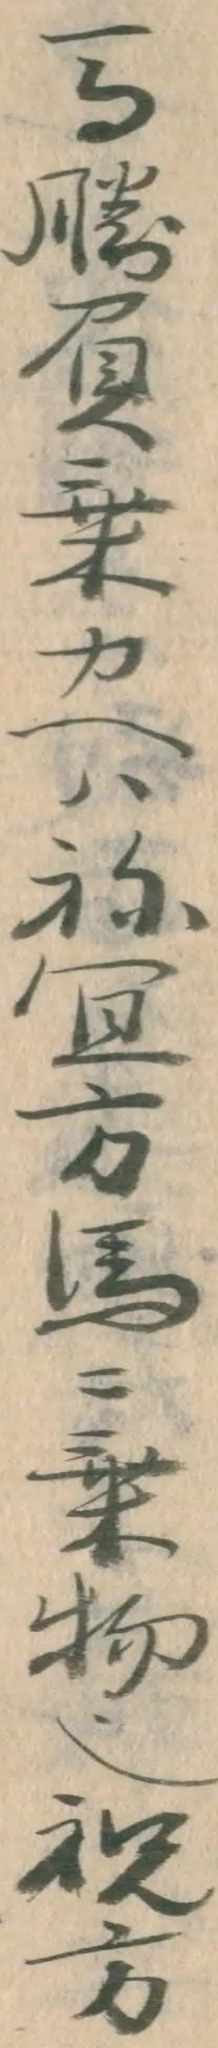馬勝負乗カヘハ祢宜方馬ニ乗物也祝方
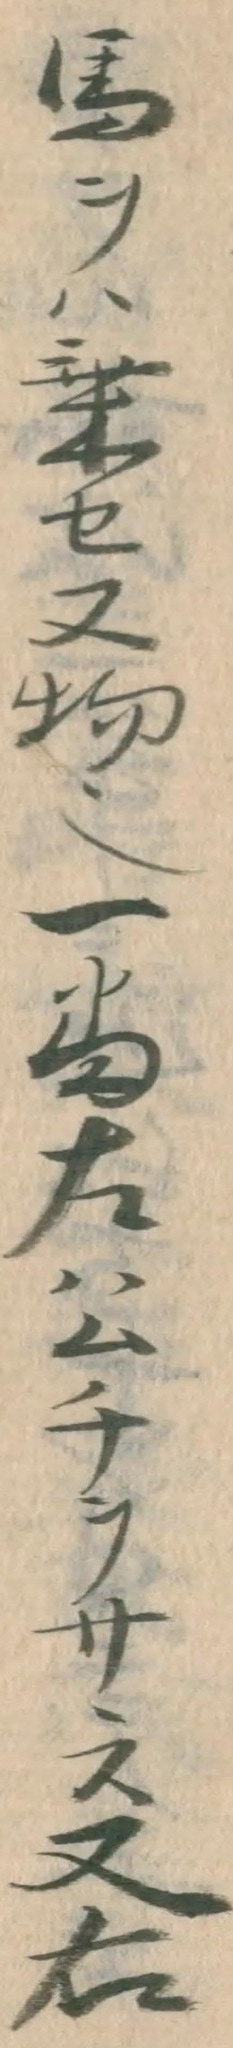馬ヲハ乗セヌ物也一番左ハムチヲサヽス又右
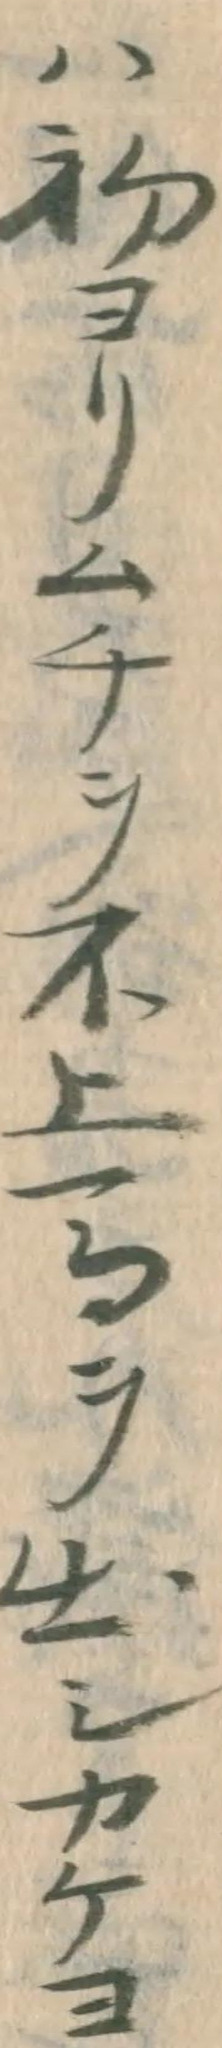ハ初ヨリムチヲ不上馬ヲ出シカケヨ
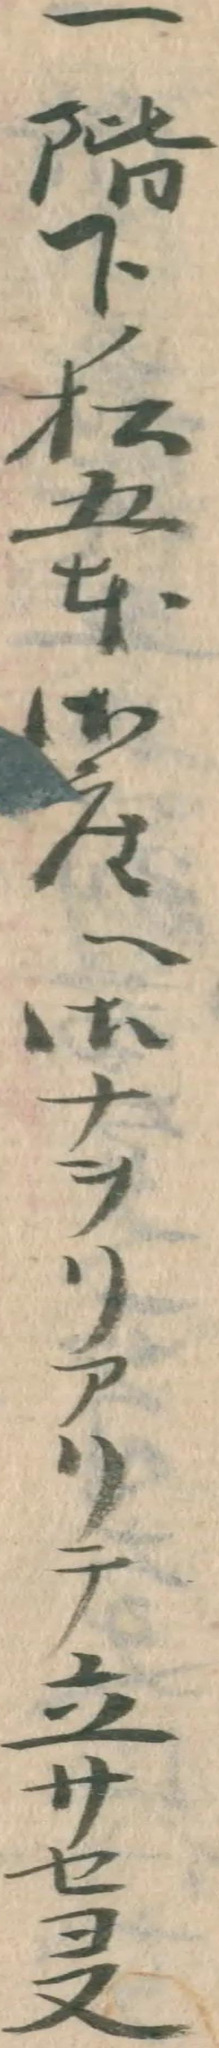一階下ノ松五本御座へ御ナヲリアリテ立サセヨ又
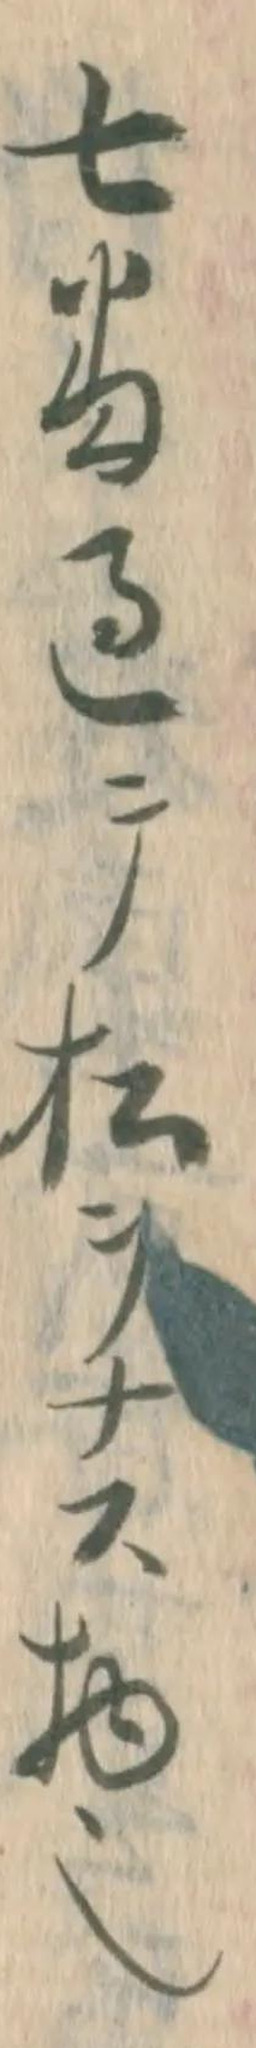七番過テ松ヲナス物也
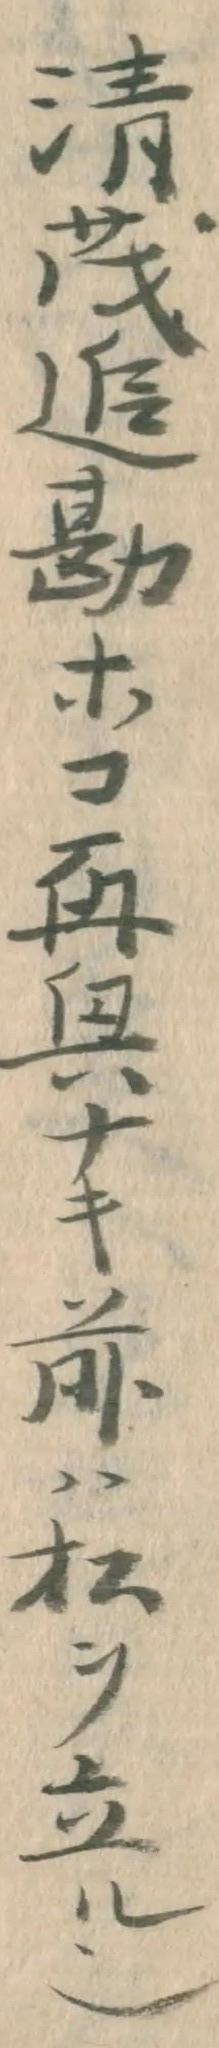清茂追勘ホコ再興ナキ前ハ松ヲ立ル也
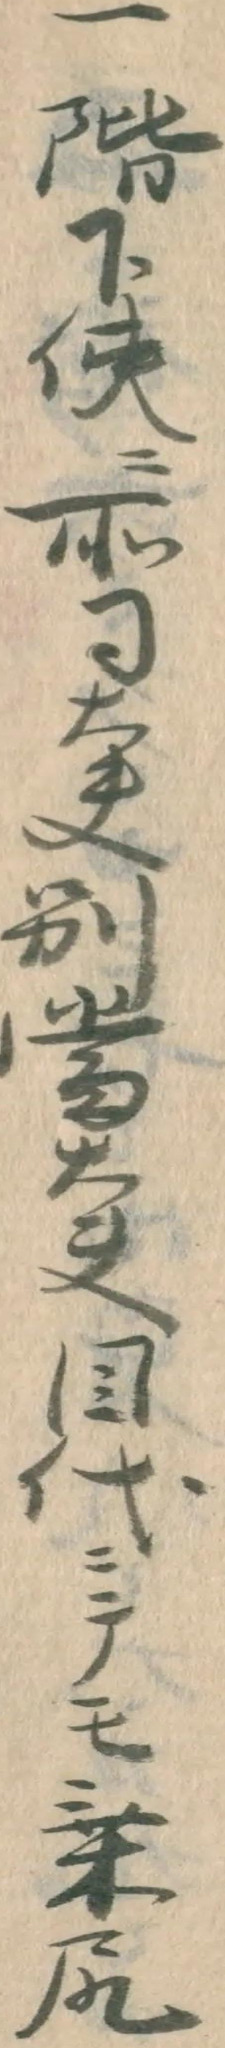一階下使ニ所司大夫別当大夫目代ニテモ乗尻
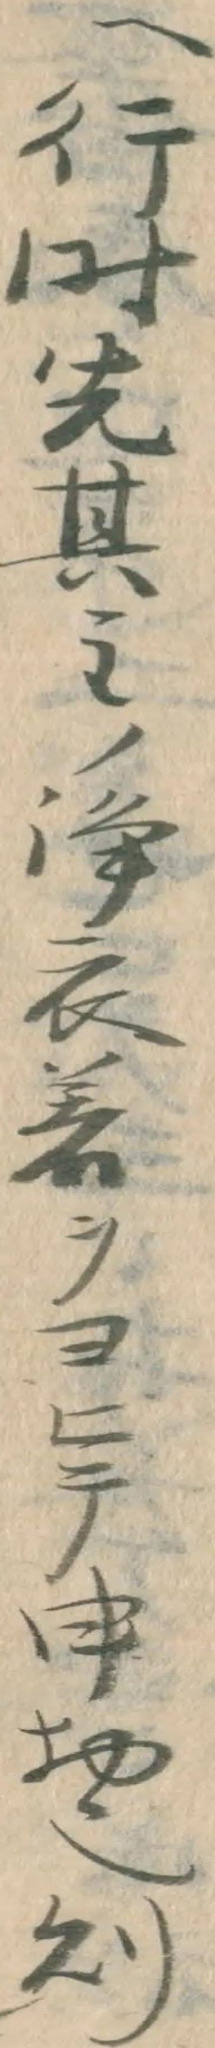ヘ行時先其主ノ浄衣着ヲヨヒテ申物也則
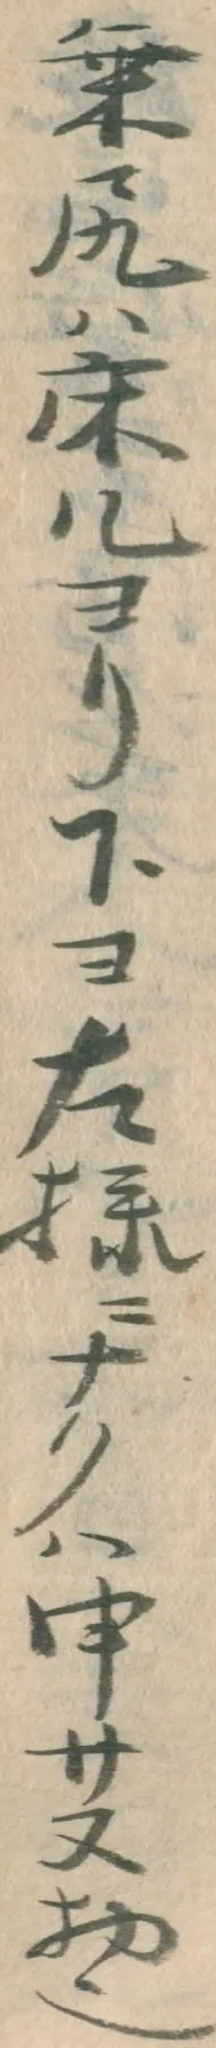乗尻ハ床几ヨリ下ヨ左様ニナクハ申サヌ物也

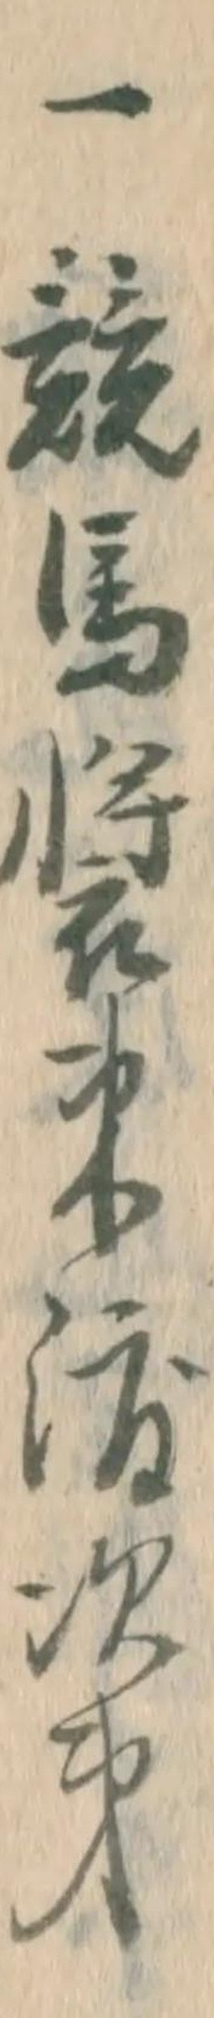一競馬装束渡次第
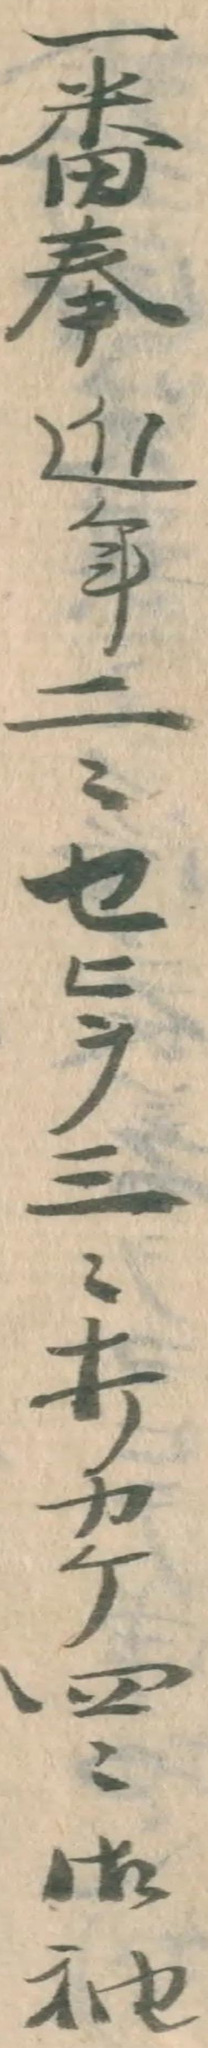一番奉近年二々セヒヲ三々打カケ四々御袖
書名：賀茂社記録. 第10冊
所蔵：国立国会図書館 National Diet Library, JAPAN
